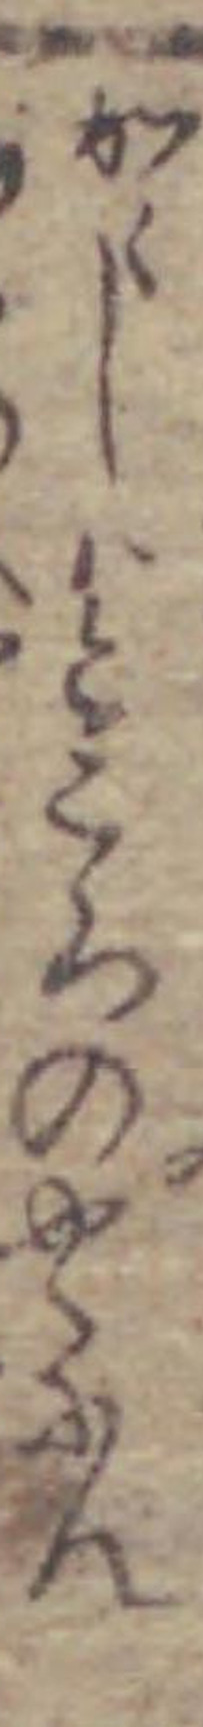からしはところのやくにん
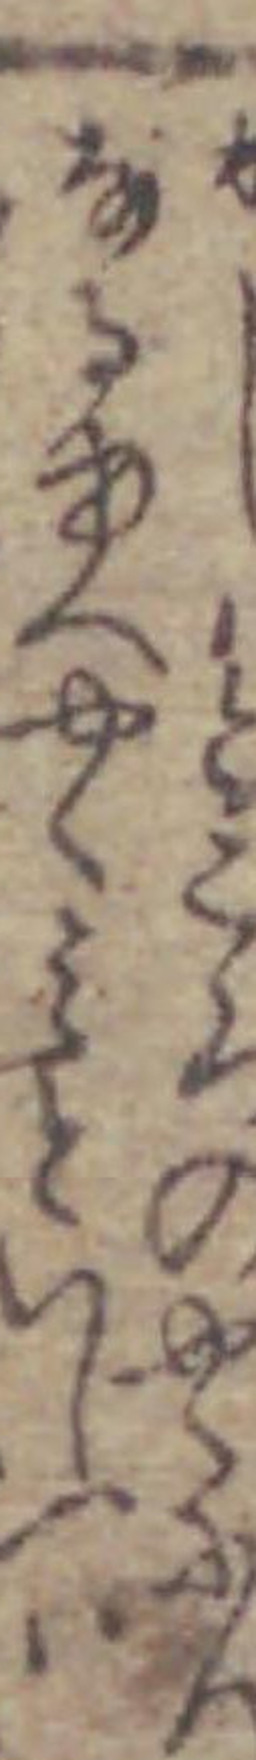なるゆへやくみといふは
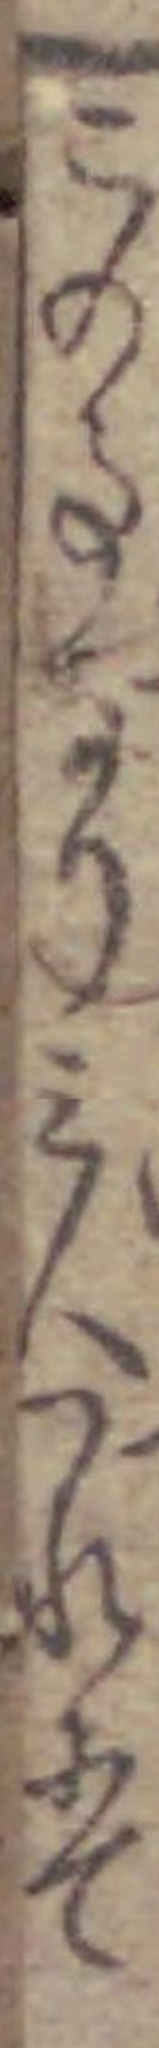この事なり三人つれにて
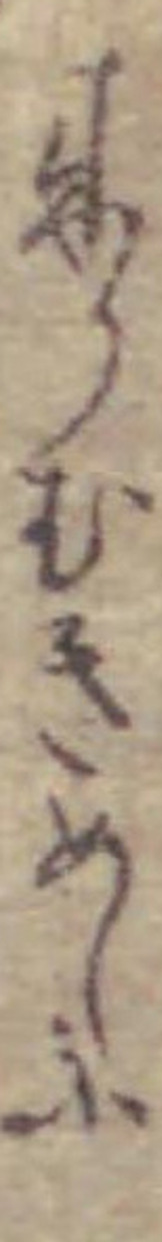来りむきめしに
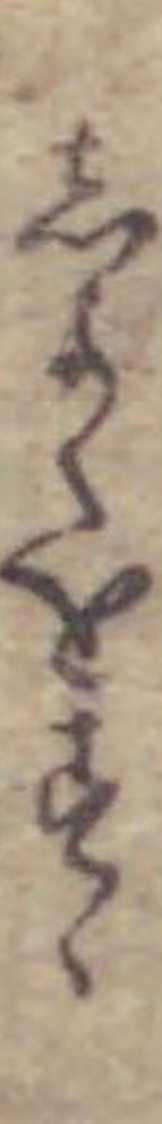しよくをすゝ

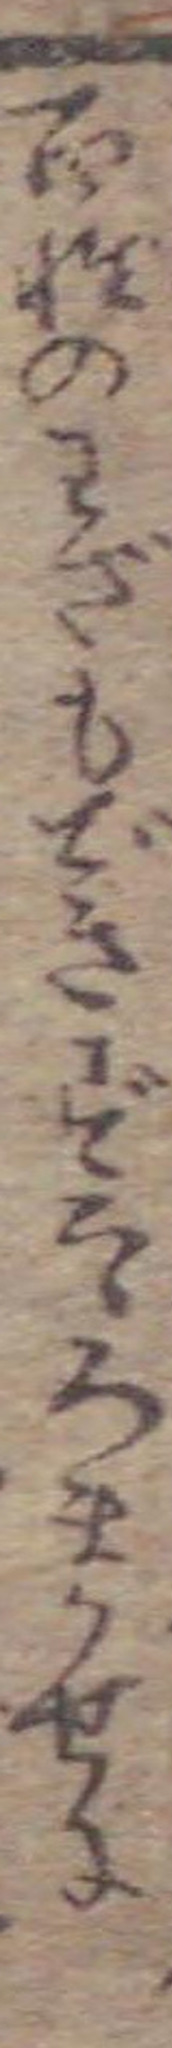百性のわざもできずこゝろまかせに
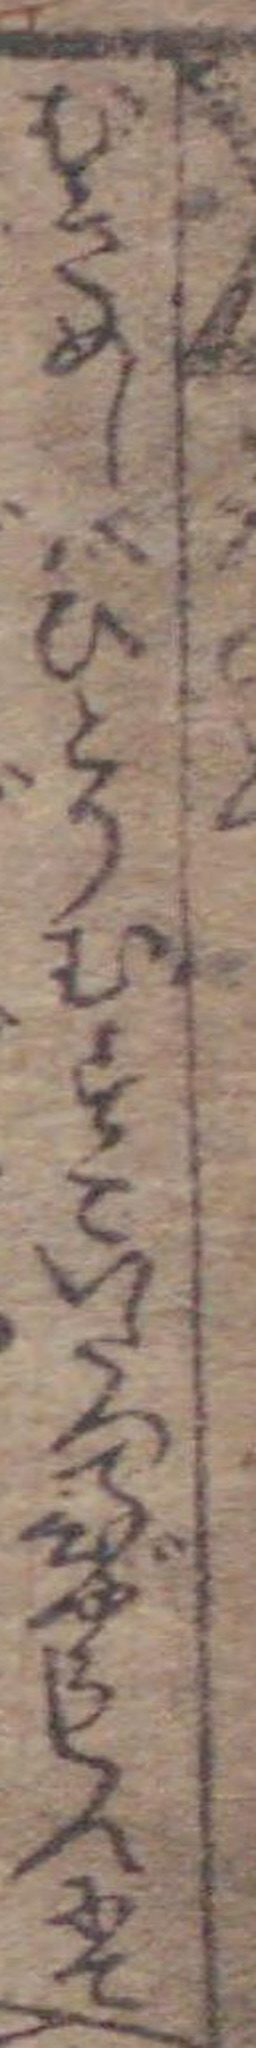むきめしはひとりむすこいたつてびやうしんにて
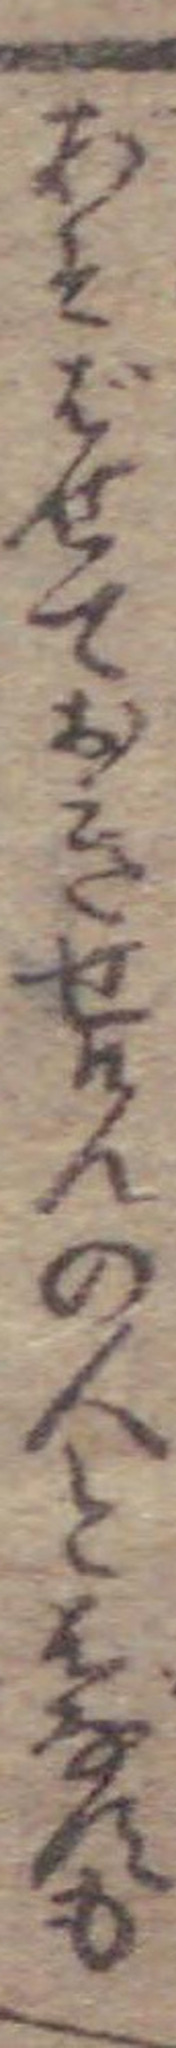あそばせておきせけんの人とはなすも
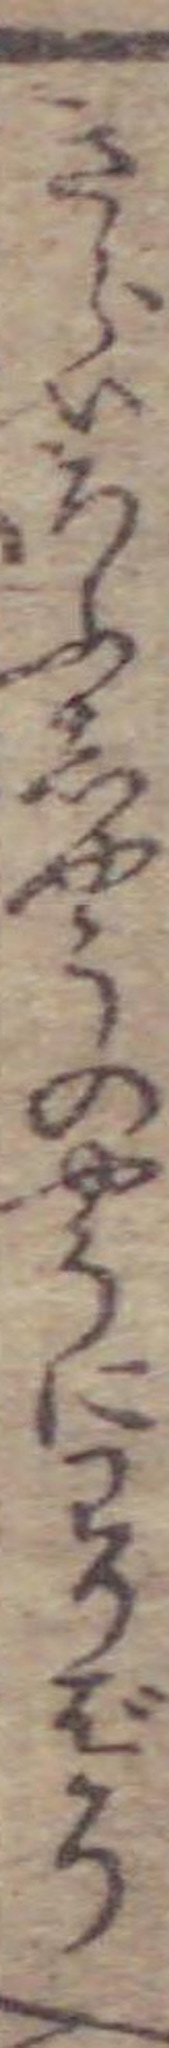きらいろふしやうのやうにわりばかり
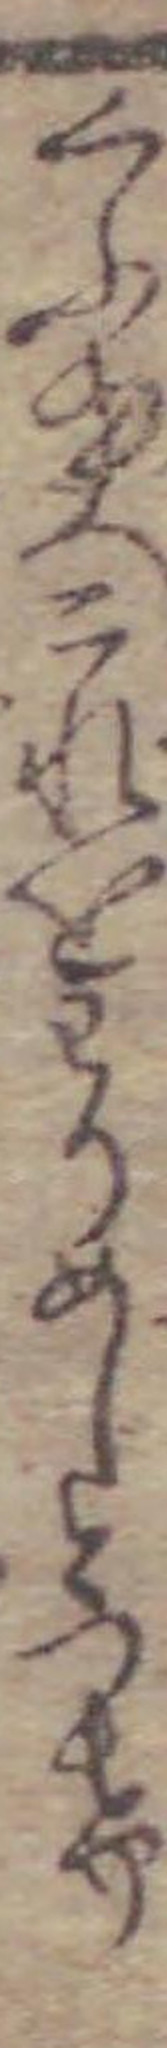くふゆへこれをわりめしとつけ
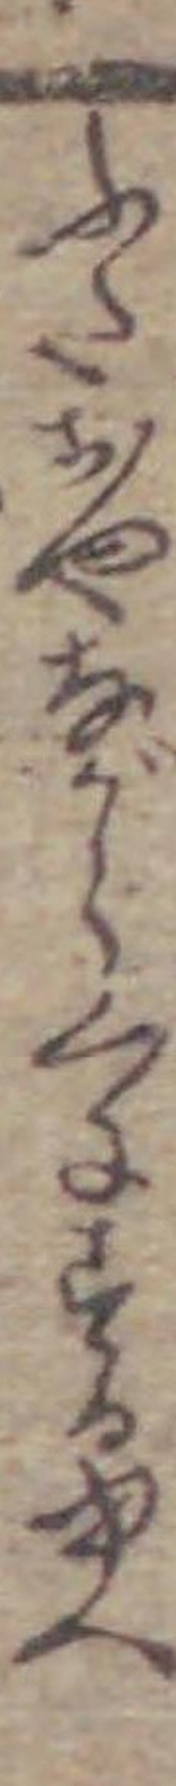ふたおやながらくにするゆへ
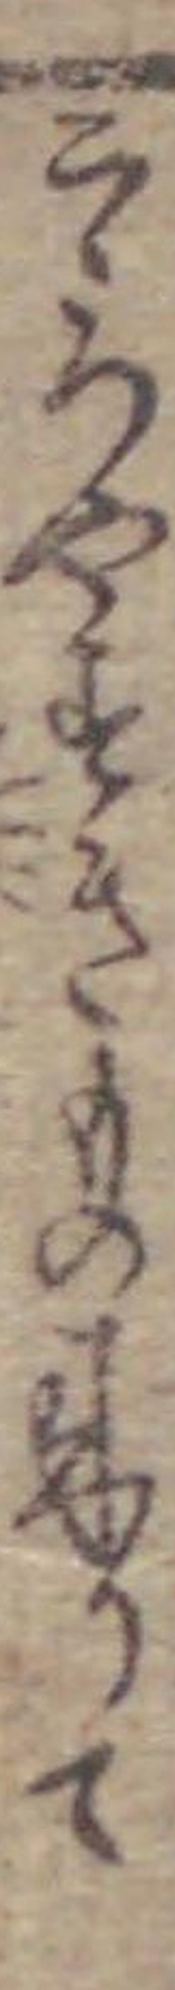こゝろやすきもの来りて
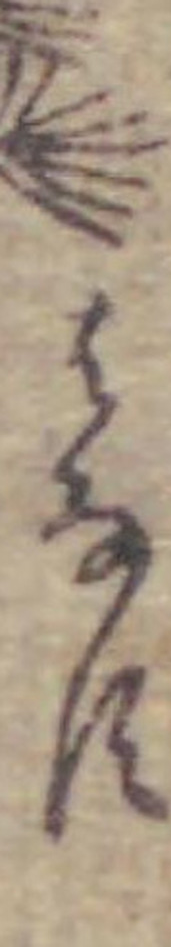はなす
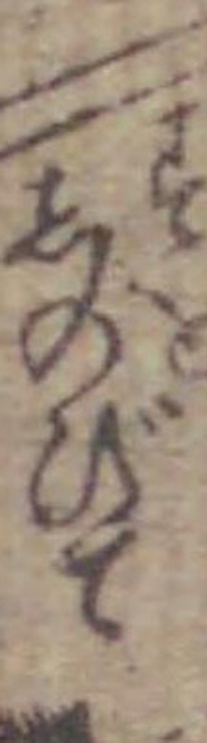しのびて
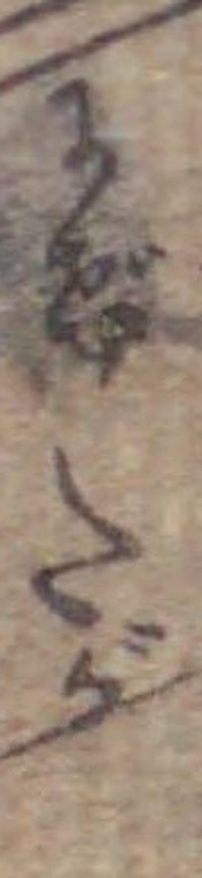にげたが
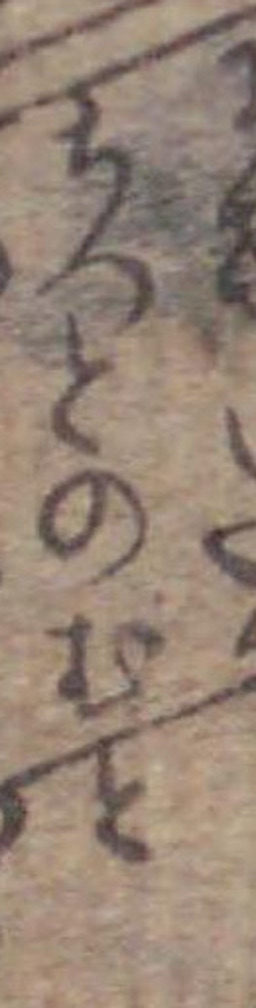ちつとのむと
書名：諸事米の飯 : 3巻
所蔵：国立国会図書館 National Diet Library, JAPAN
